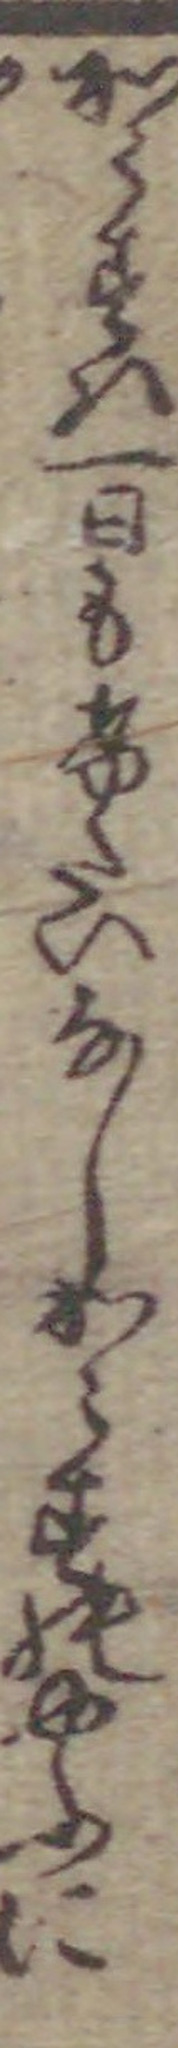からすハ一日もけたいなしからすのやふに
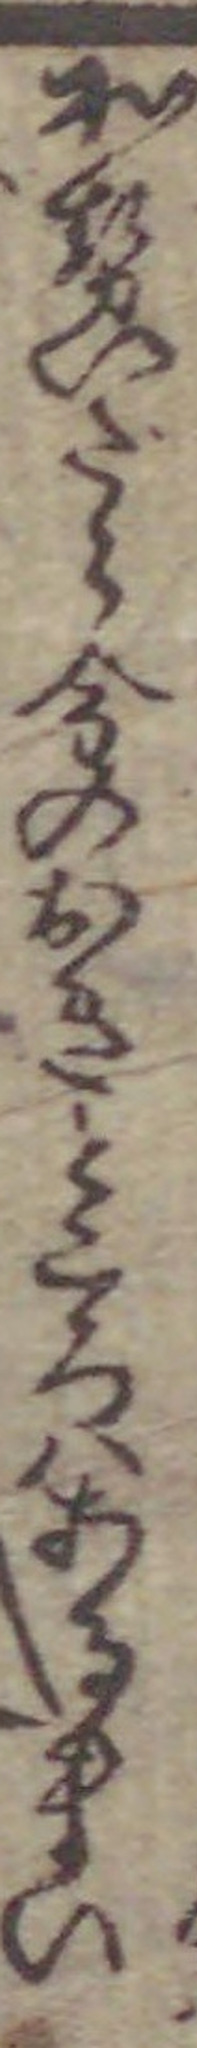かせいだら金のおきところハあるまい
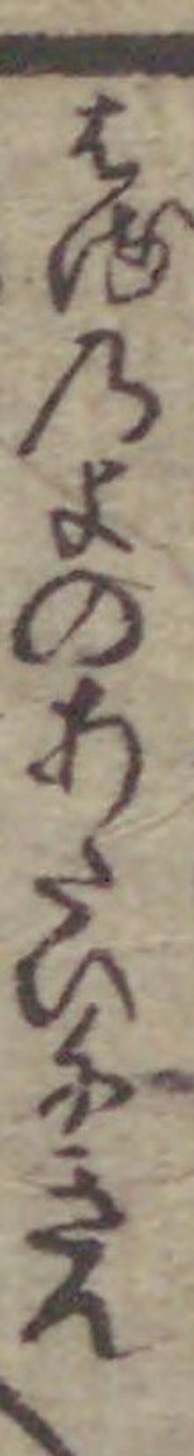はるのよのあたい千きん
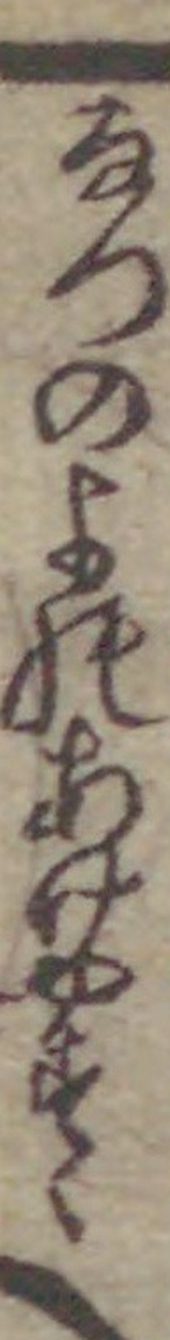なつのよのあけやすく
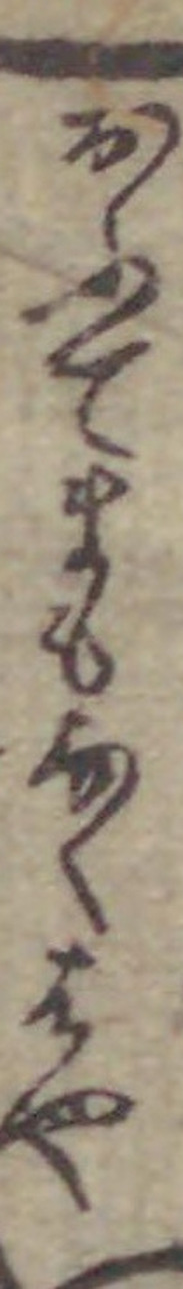おふてまもなくはや
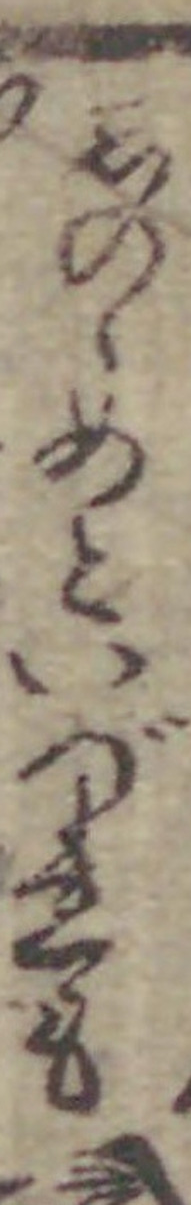しのゝめといづれも
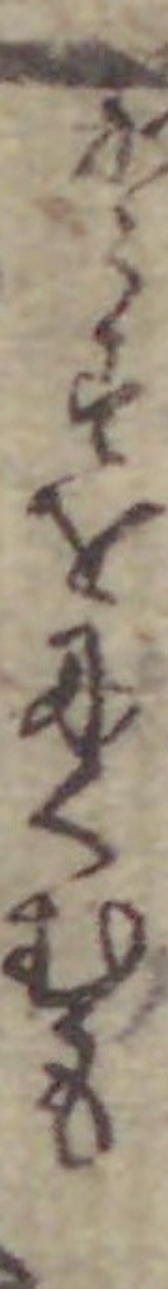からすをにくむも
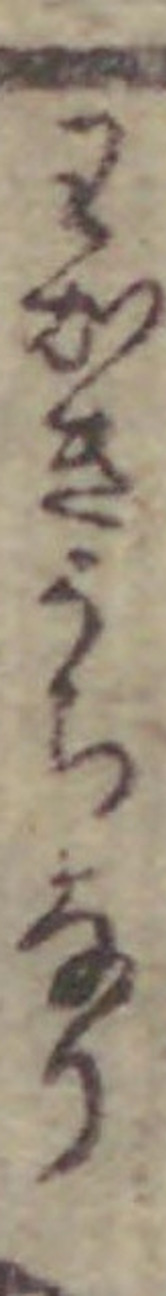わかきうちなり
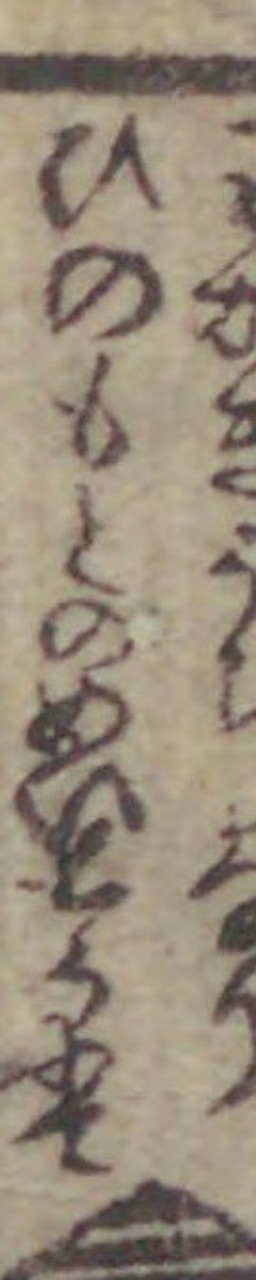ひのもとのめいてうにて
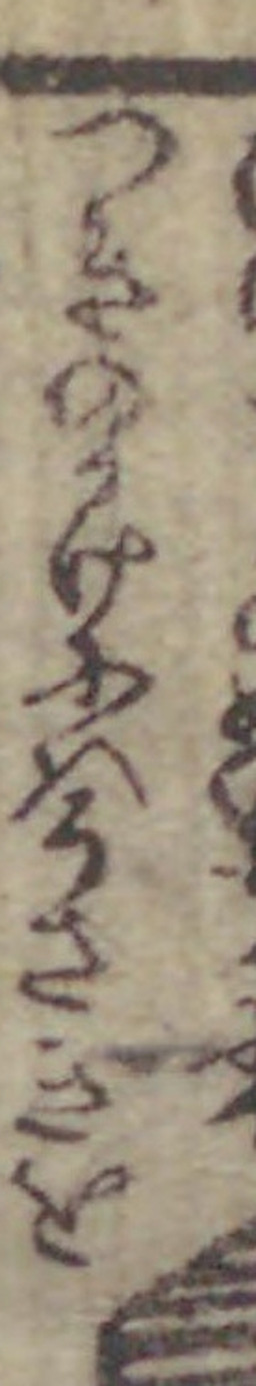つきのかけにハうさきを
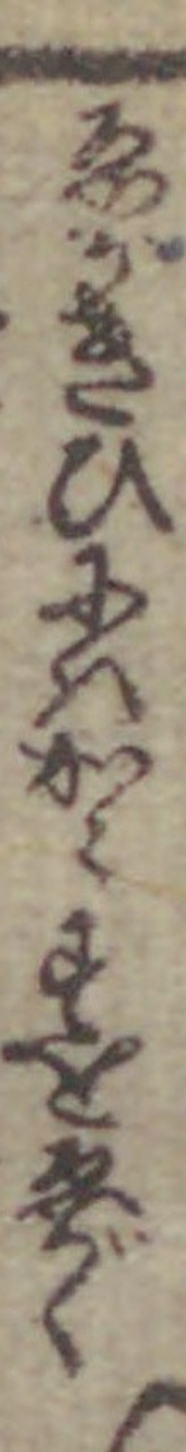ゑがきひにハからすをゑがく
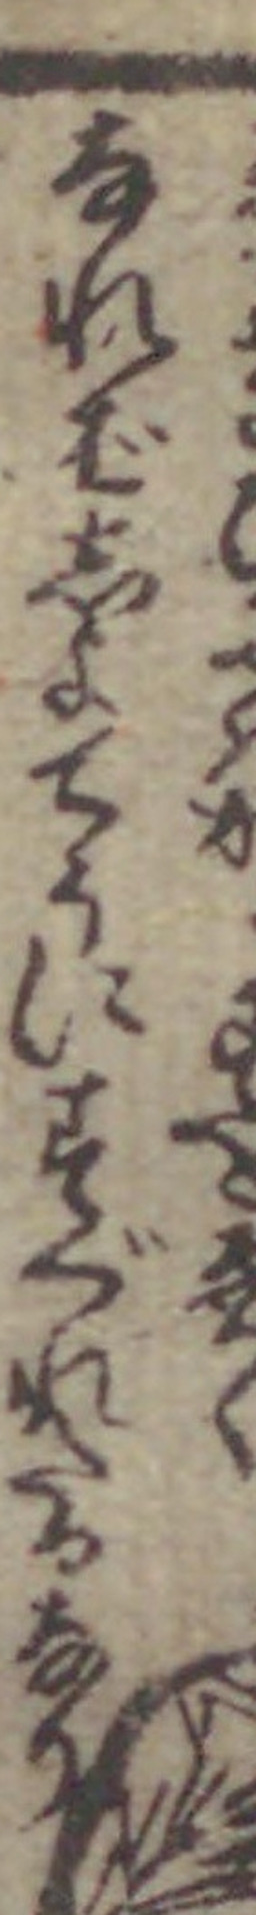なればしよてうにすぐれたるなり
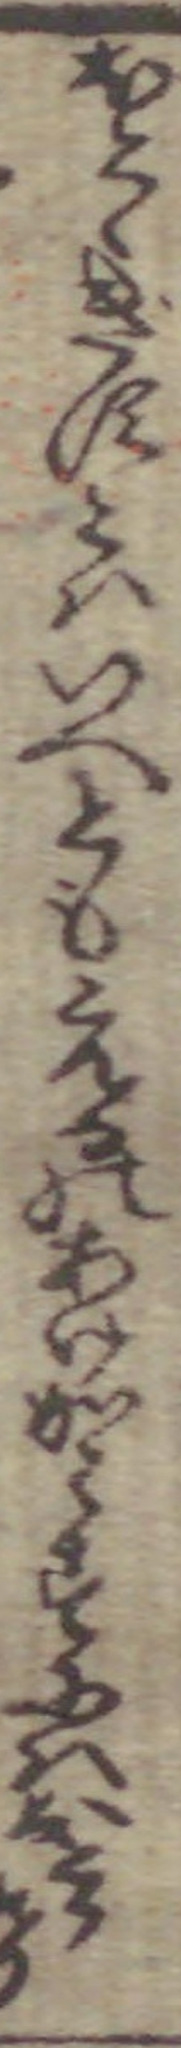ほとゝぎすとハいへとも元日のあけからすにハおとりけり
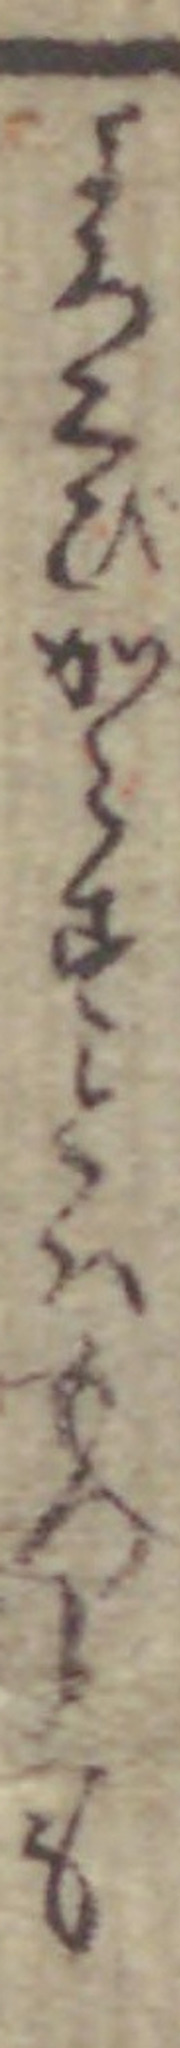よろこびからすとハもつとも
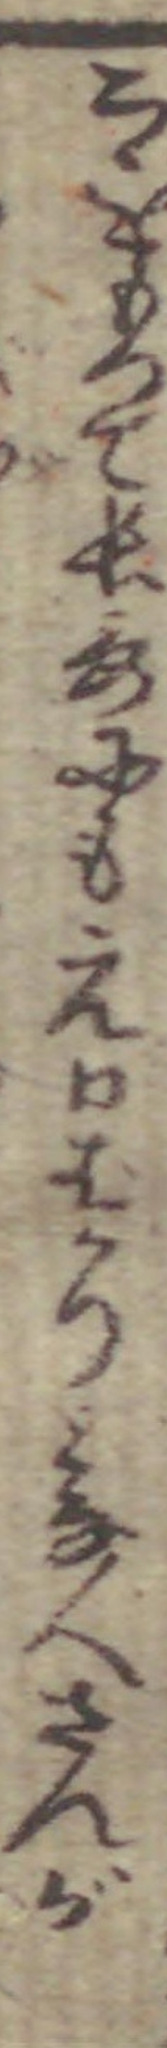こゝをもつて長哥にも元日ばかりミな〳〵さんが
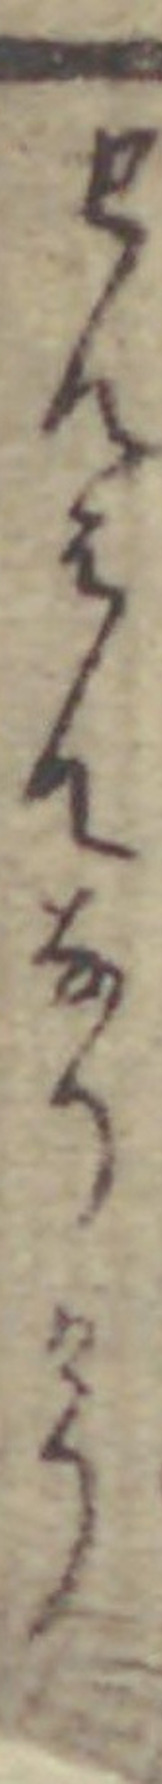せんはんなりけり
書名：烏行水諺草 3巻
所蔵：国立国会図書館 National Diet Library, JAPAN
